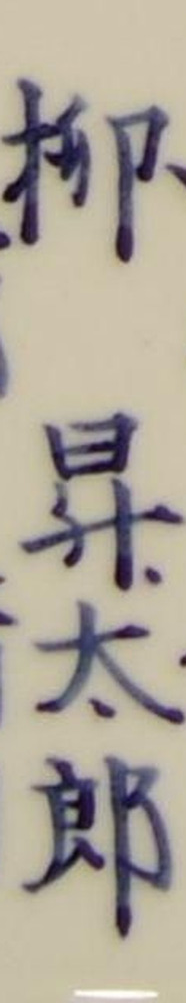柳昇太郎
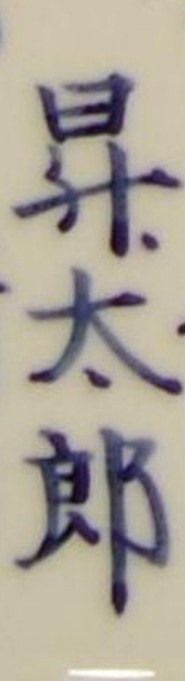柳昇太郎
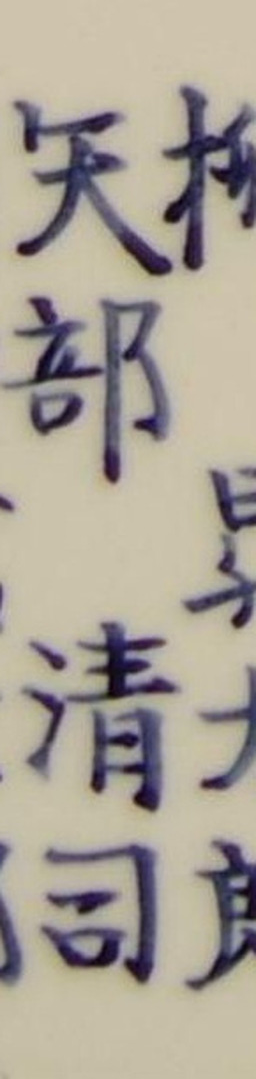矢部清司
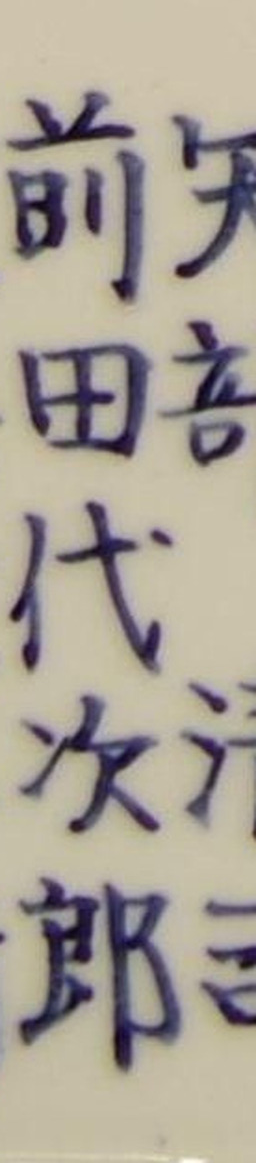前田代次郎
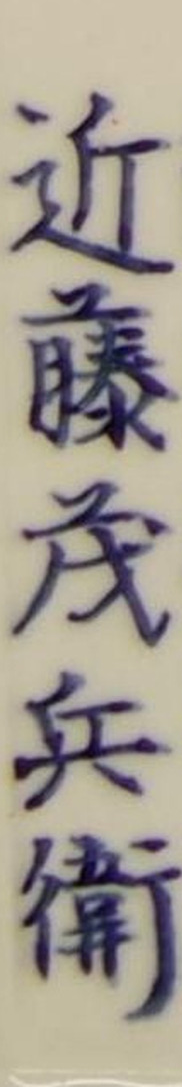近藤茂兵衛

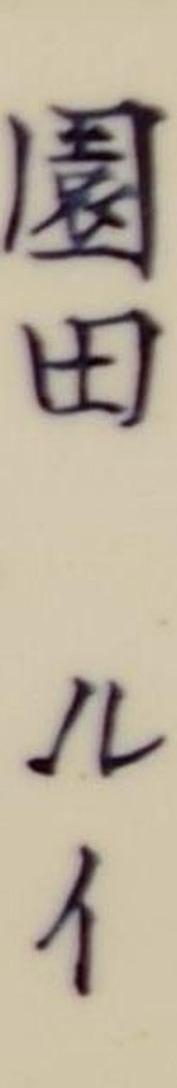園田ルイ
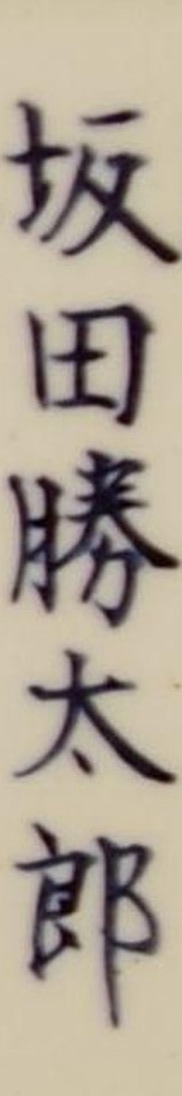坂田勝太郎
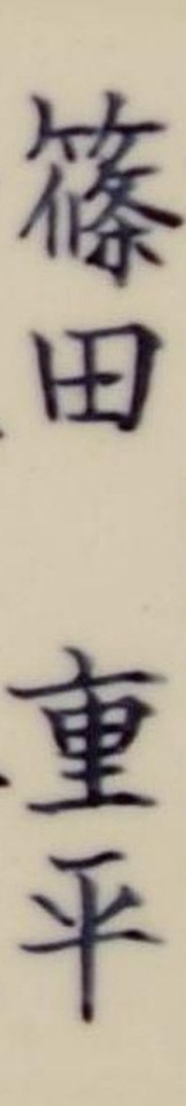篠田重平
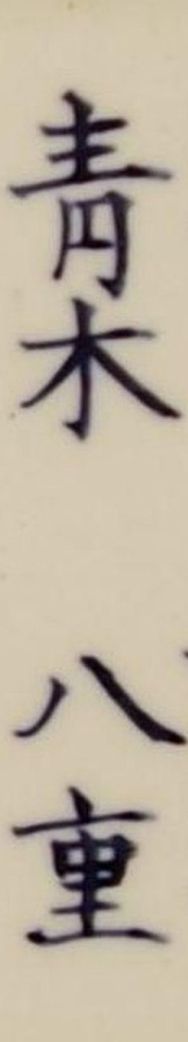青木八重
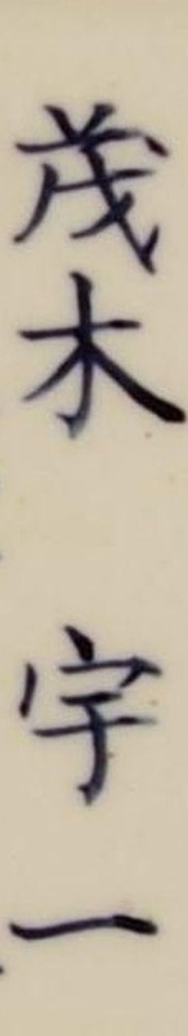茂木宇一
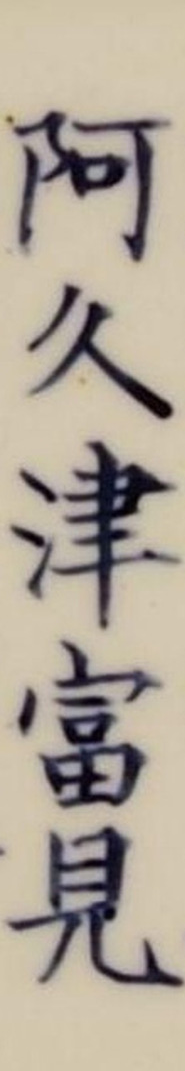阿久津富見
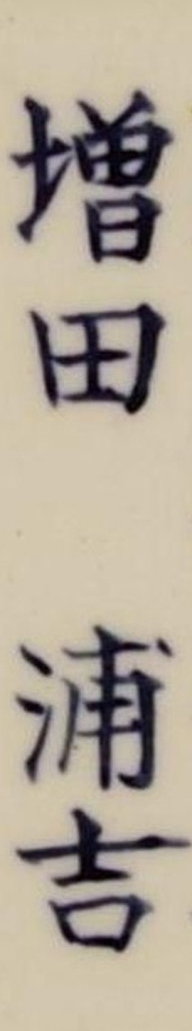増田浦吉
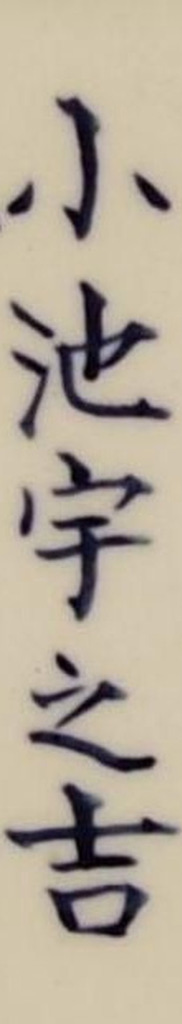小池宇之吉
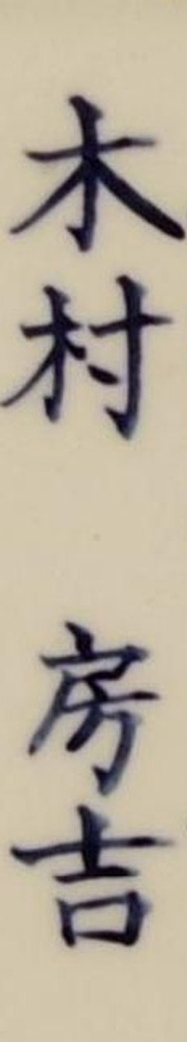木村房吉
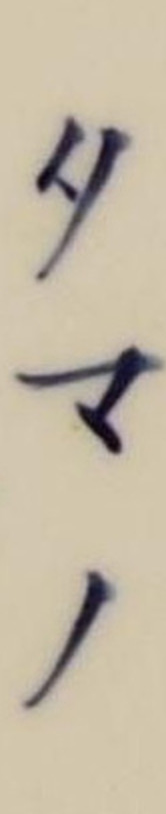タマノ
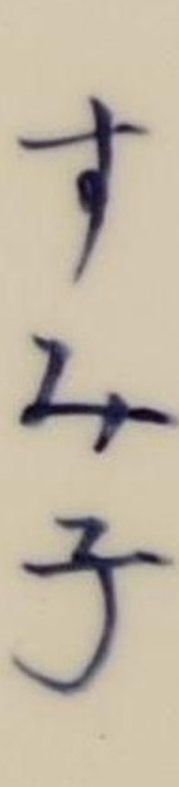すみ子
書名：A~D
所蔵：koyasan kongobuji
